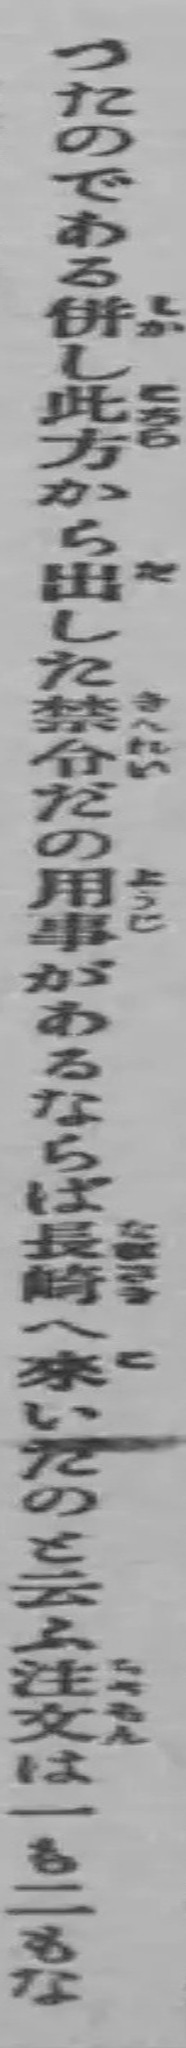つたのである併し此方から出した禁令だの用事があるならば長崎へ来いだのと云ふ注文は一も二もな
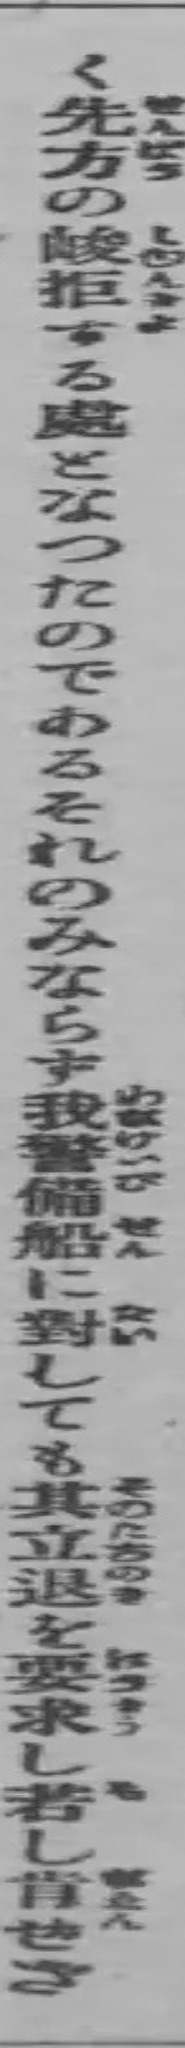く先方の峻拒する処となつたのであるそれのみならず我警備船に対しても其立退を要求し若し肯ぜざ
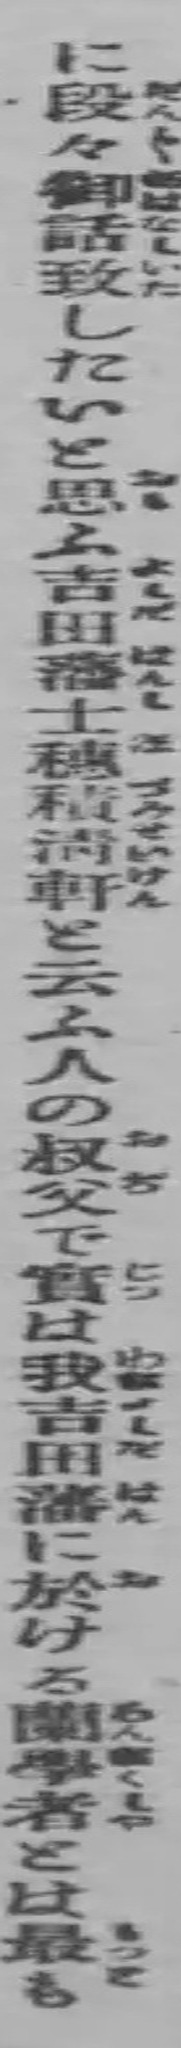に段々御話致したいと思ふ吉田藩士穂積清軒と云ふ人の叔父で実は我吉田藩に於ける蘭学者とは最も
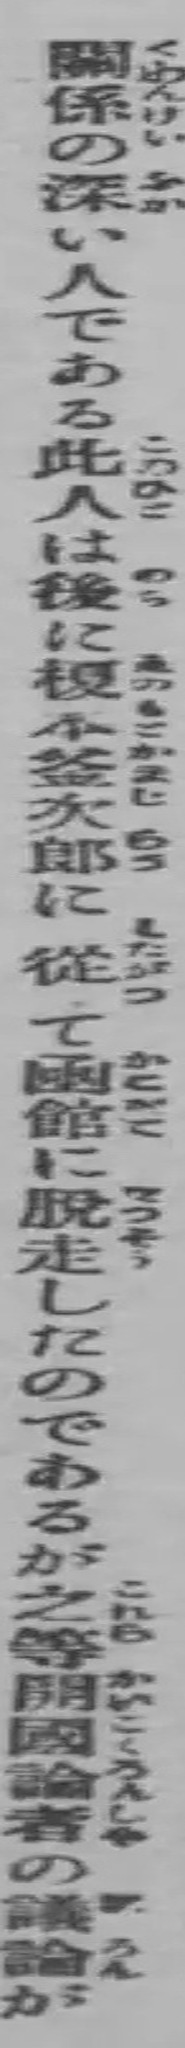関係の深い人である此人は後に榎本釜次郎に従て函館に脱走したのであるが之等開国論者の議論が
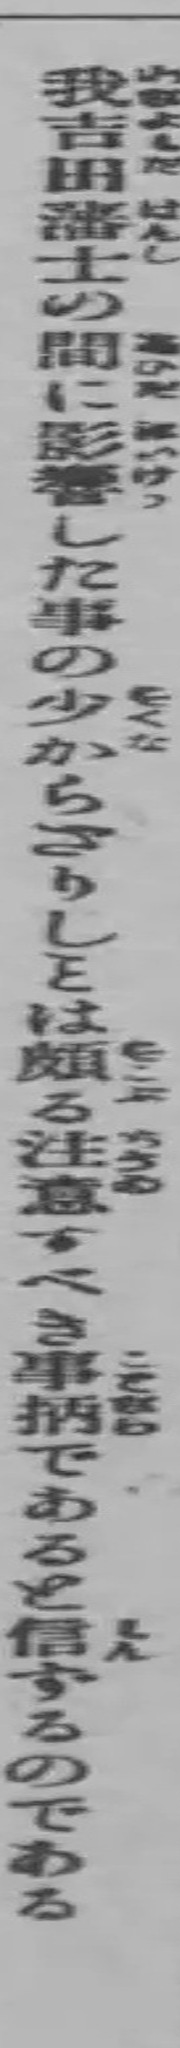我吉田藩士の間に影響した事の少からざりしことは頗る注意すべき事柄であると信ずるのである
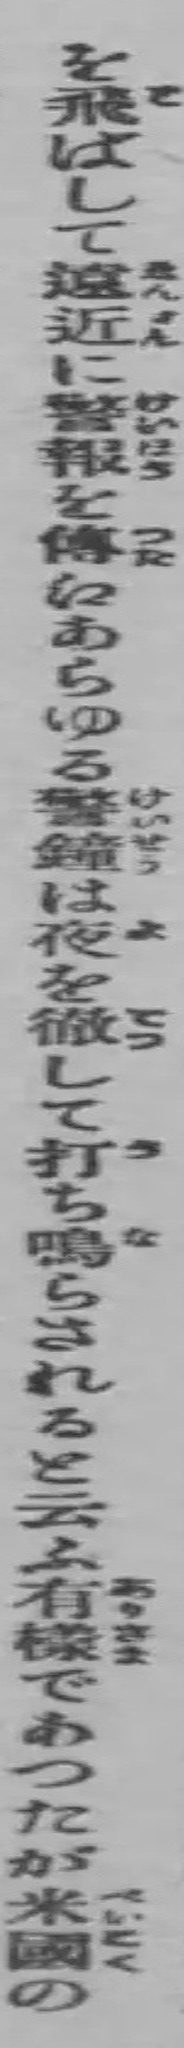を飛ばして遠近に警報を伝えあらゆる警鐘を夜を徹して打ち鳴らされると云ふ有様であつたが米国の
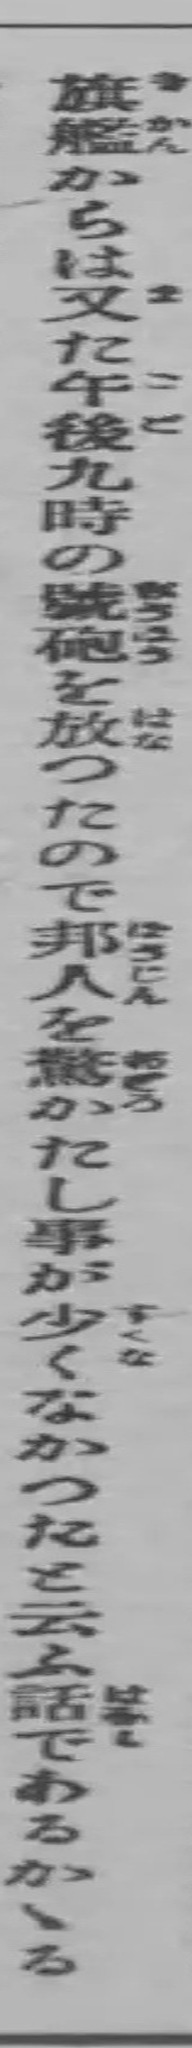旗艦からは又た午後九時の号砲を放つたので邦人を驚かした事が少くなかつたと云ふ話であるかゝる
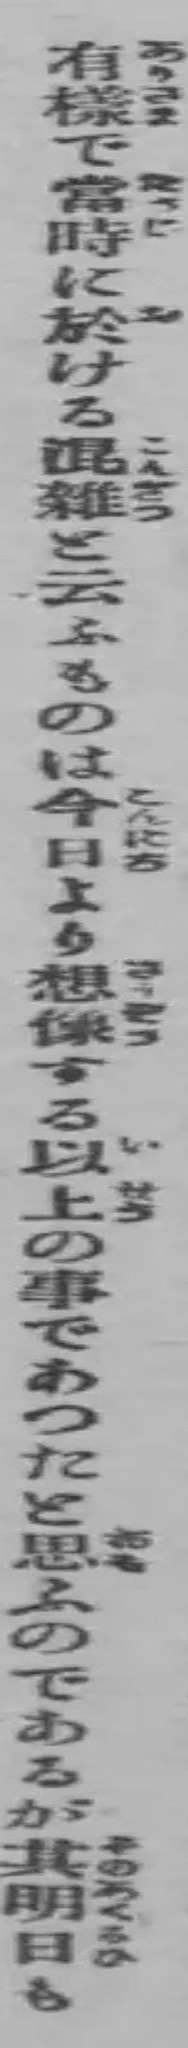有様で当時に於ける混雑と云ふものは今日より想像する以上の事であつたと思ふのであるが其明日も
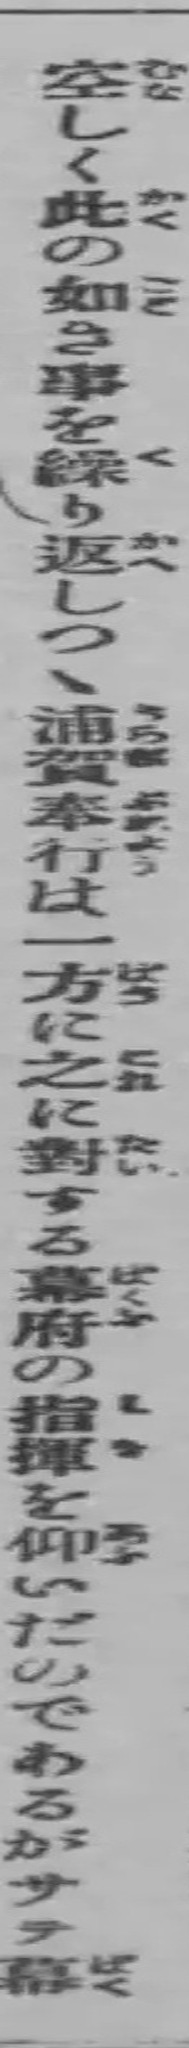空しく此の如き事を繰り返しつゝ浦賀奉行は一方に之に対する幕府の指揮を仰いだのであるがサテ幕
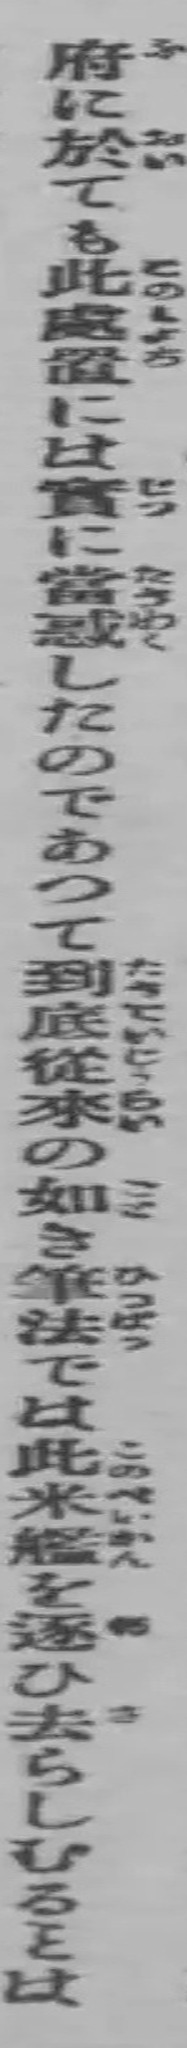府に於ても此処置には実に当惑したのであつて到底従来の如き筆法では此米艦を逐ひ去らしむることは
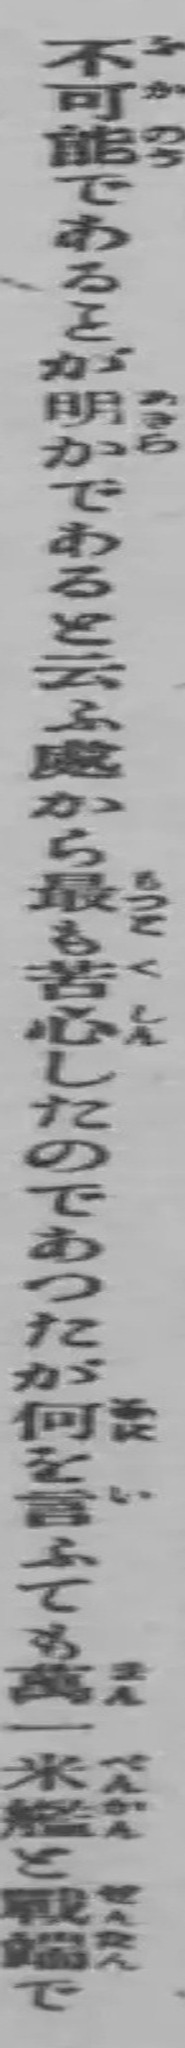不可能であることが明かであると云ふ処から最も苦心したのであつたが何を言ふても万一米艦と戦端で
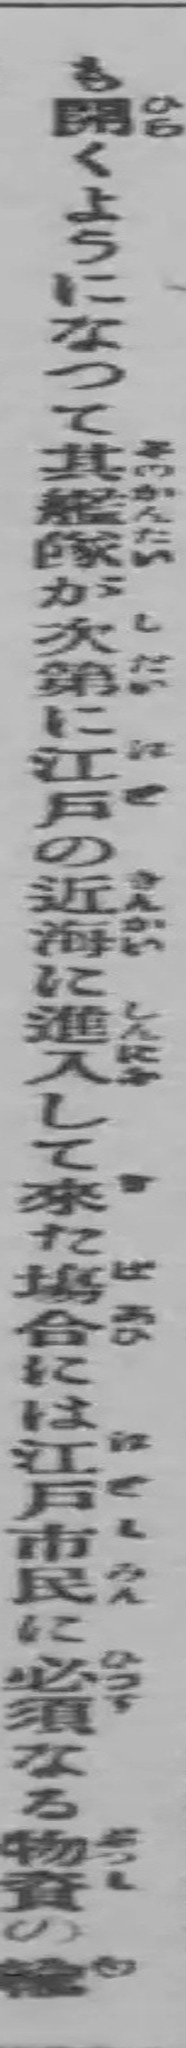も開くようになつて其艦隊が次第に江戸の近海に進入して来た場合には江戸市民に必須なる物質の輸
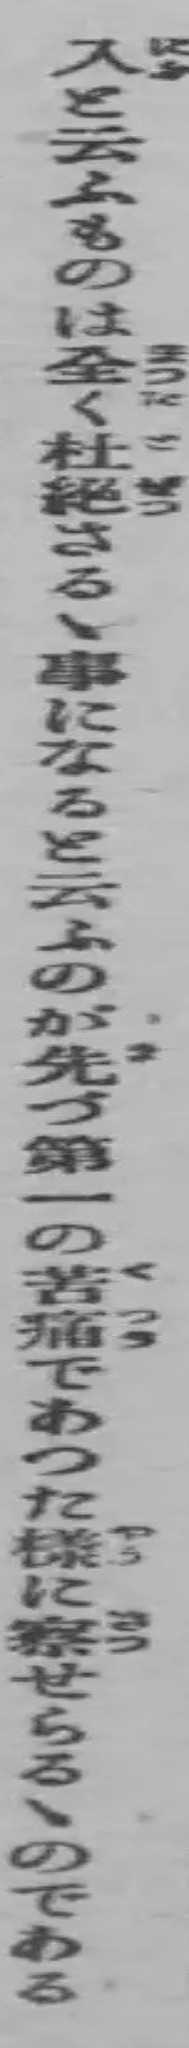入と云ふものは全く杜絶さるゝ事になると云ふのが先づ第一の苦痛であつた様に察せらるゝのである
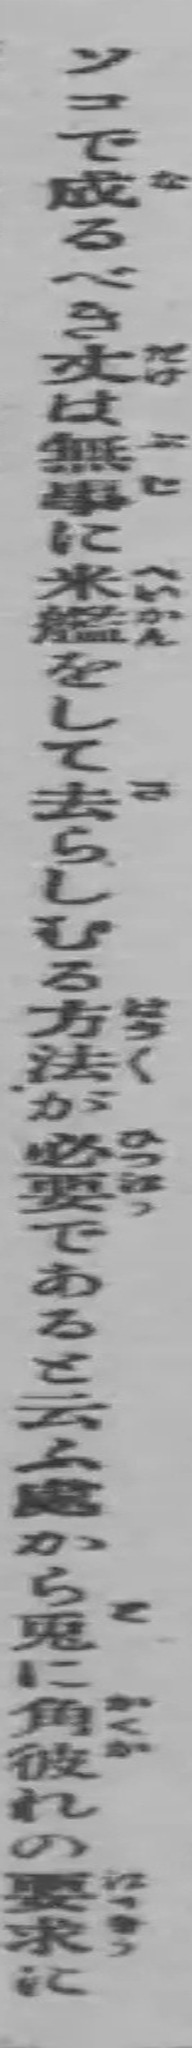ソコで成るべき丈は無事に米艦をして去らしむる方法が必要であると云ふ処から兎に角彼れの要求に
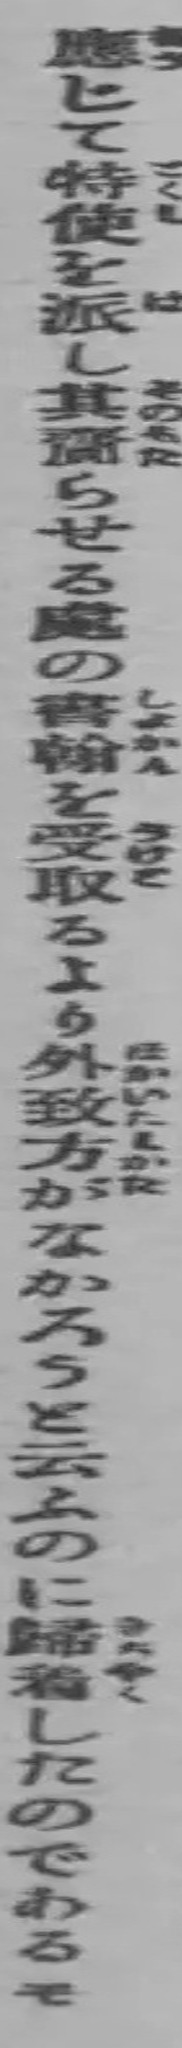応じて特使を派し其齎らせる処の書翰を受取るより外致方がなかろうと云ふのに帰着したのであるモ

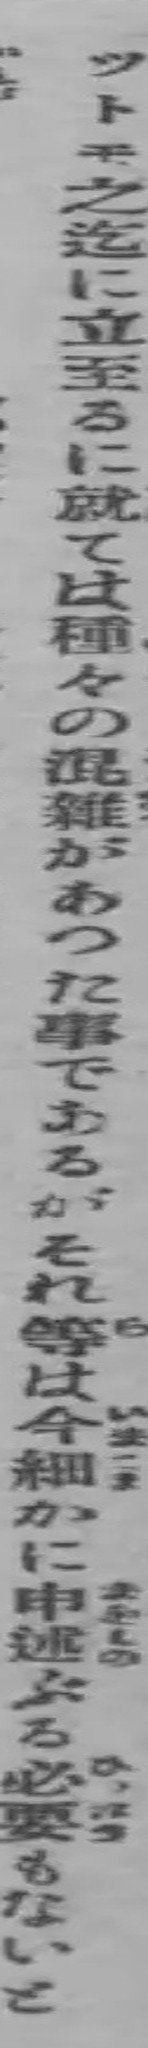ツトモ之迄に立至るに就ては種々の混雑があつた事であるがそれ等は今細かに申述ぶる必要もないと
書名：豊橋市史談
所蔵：国立国会図書館 National Diet Library, JAPAN
